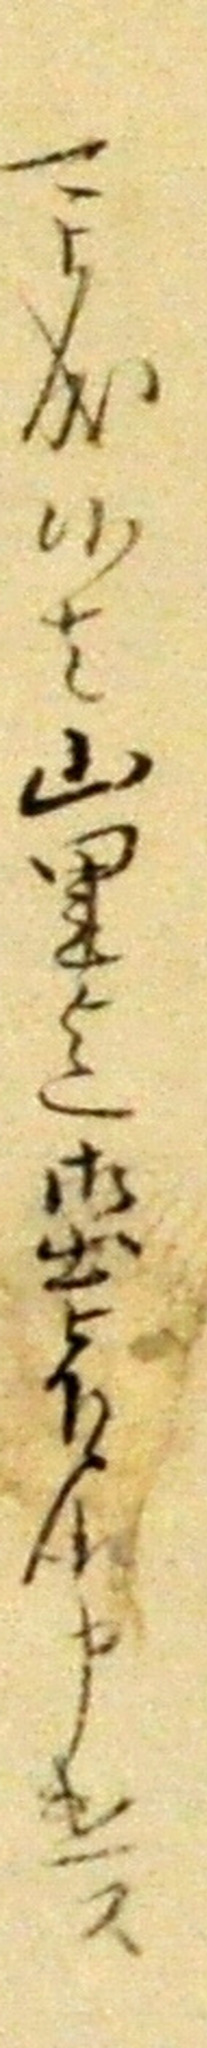可被成候は山里迄御出被下候様申遣ス
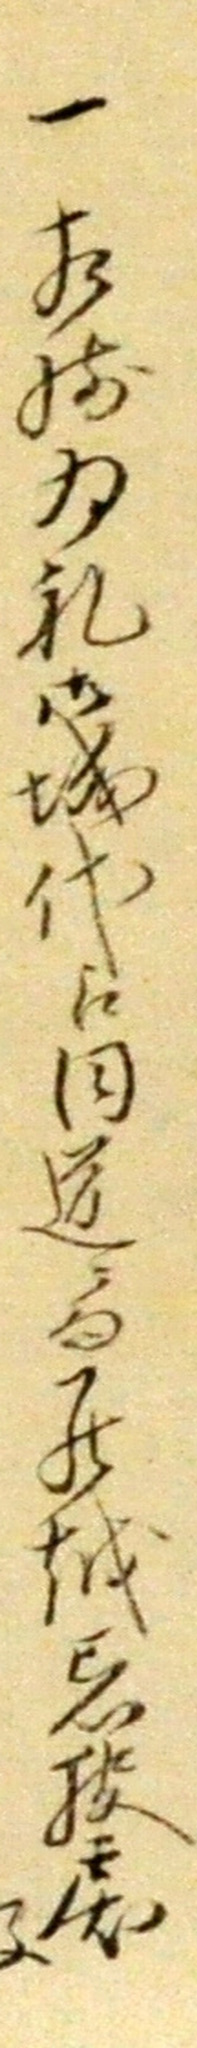一相揃為礼御城代え同道に而罷越着服戻子
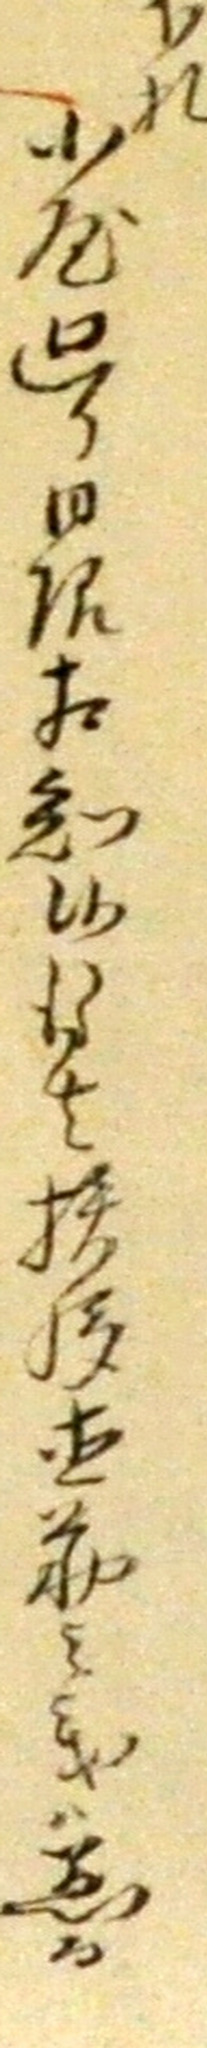小屋廻り日限相知候得は挨拶直勤之義は兼而
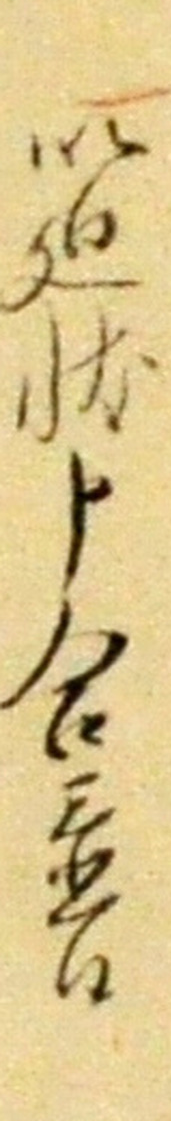以廻状申合置候
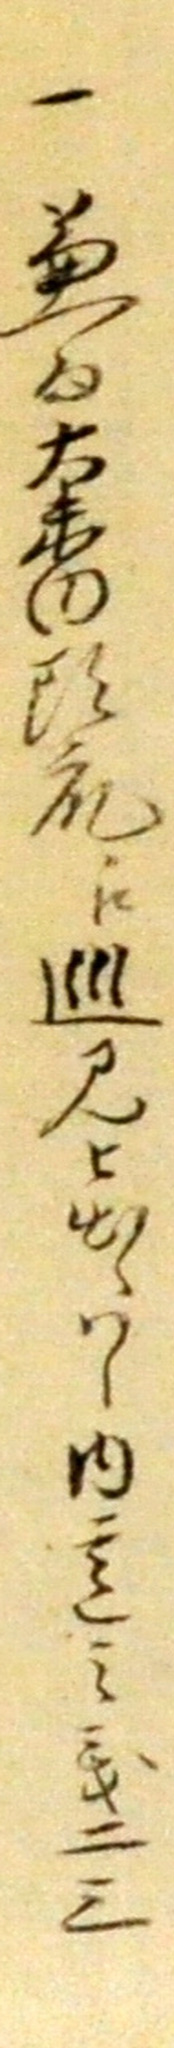一兼而大番頭衆え巡見被出候はゝ内意之義二三
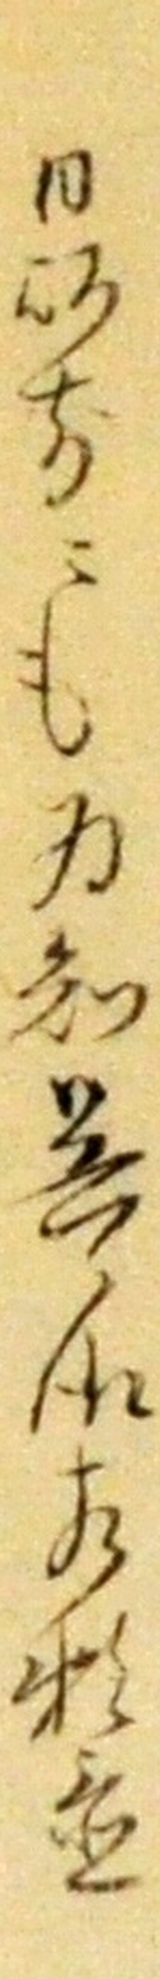日以前にも為知呉候様頼置
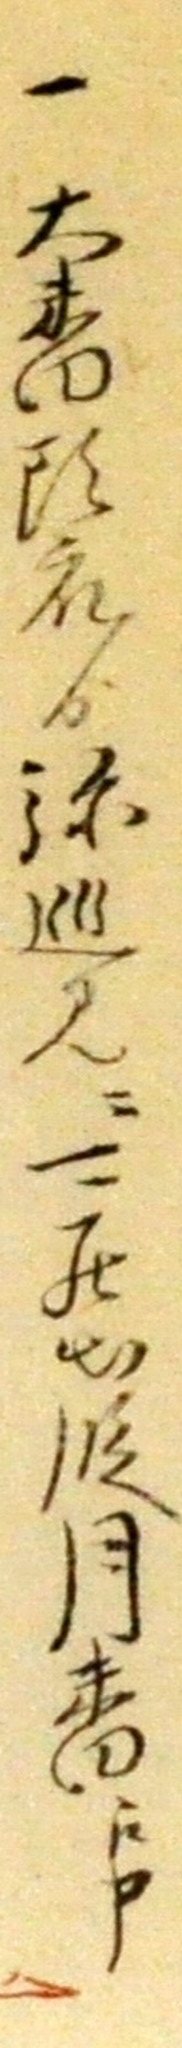一大番頭衆ゟ弥巡見に可罷出段月番え申
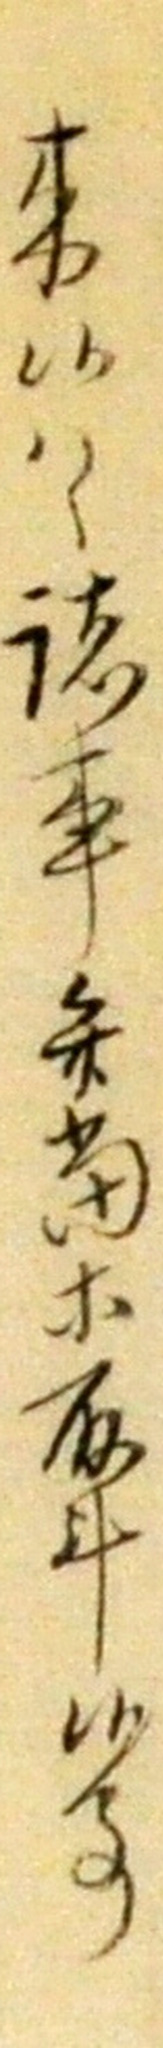来候はゝ諸事弁当等取計候事
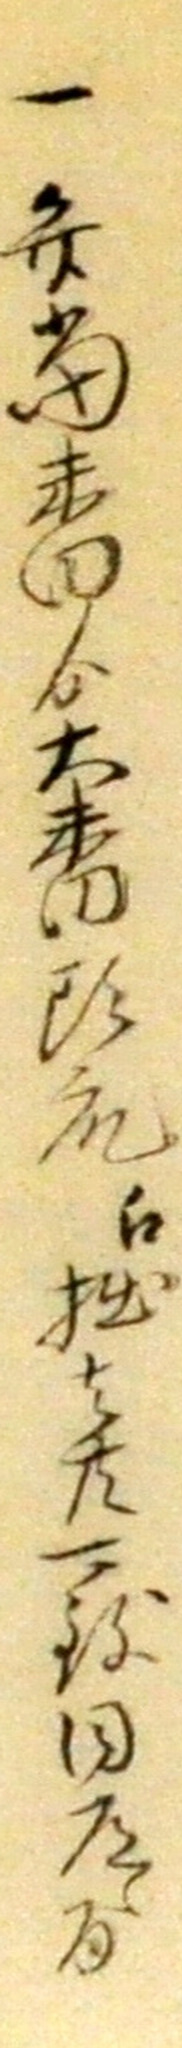一弁当番ゟ大番頭衆え拙者共可致同道候間
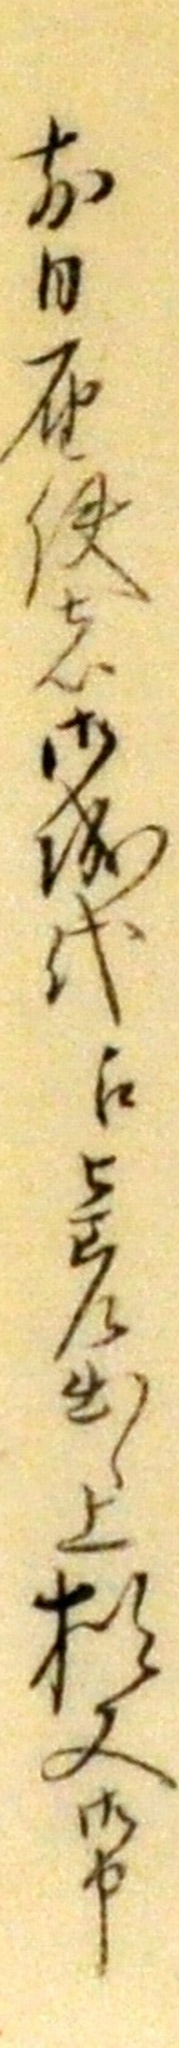前日届使者御城代え差出候上猶又御申
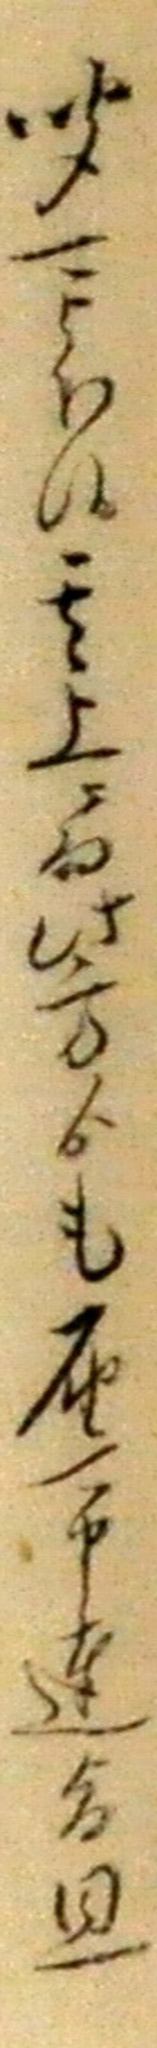聞可被下候其上に而此方ゟも届可申達旨且
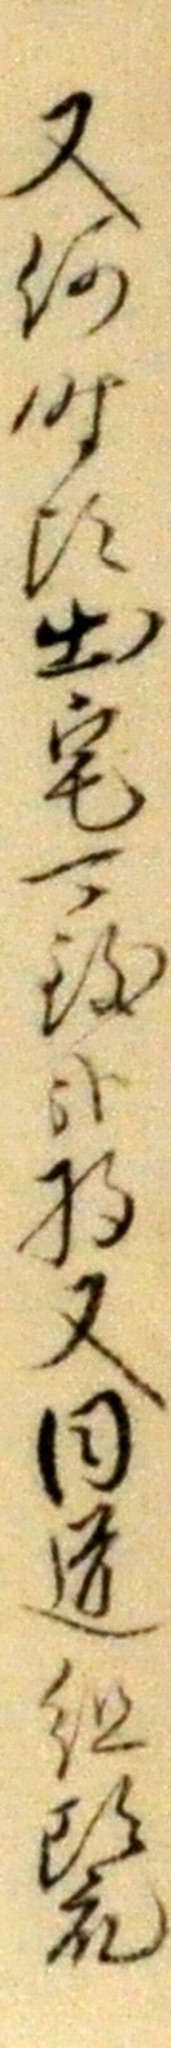又何時頃出宅可致哉将又同道組頭衆
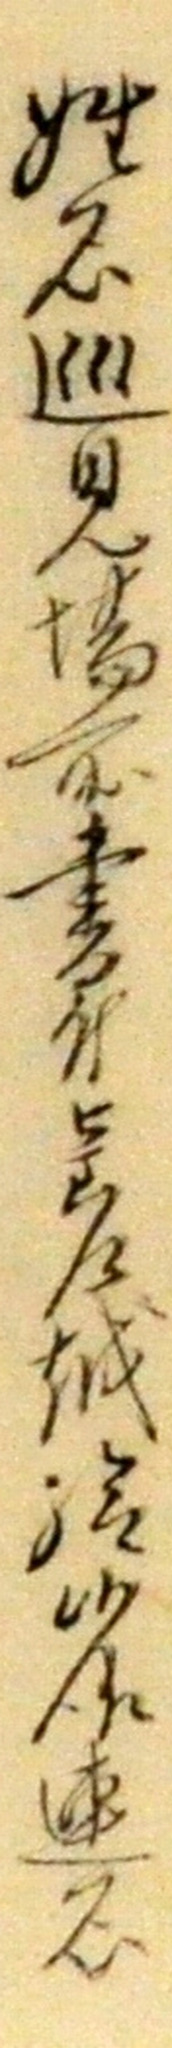姓名巡見場所書付被差越給候様連名
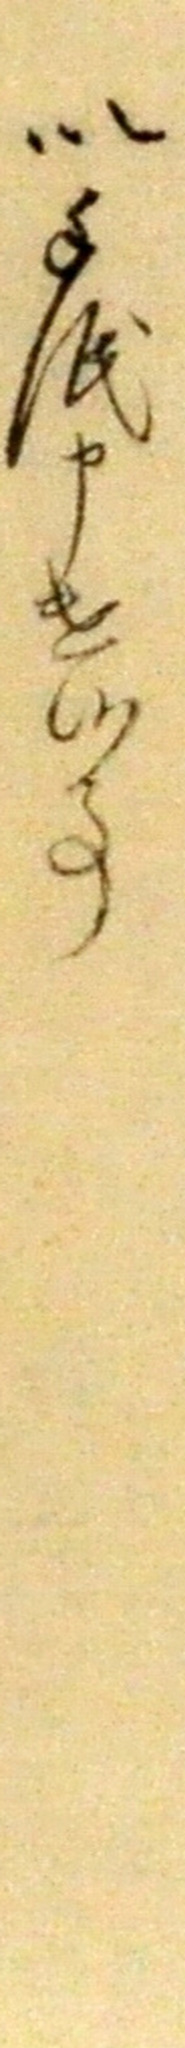以手紙申遣候事
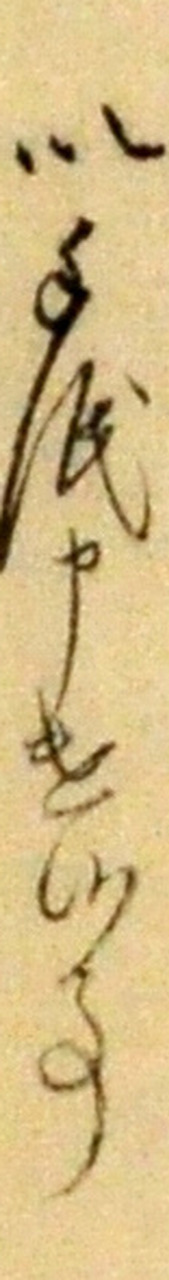以手紙申遣候事
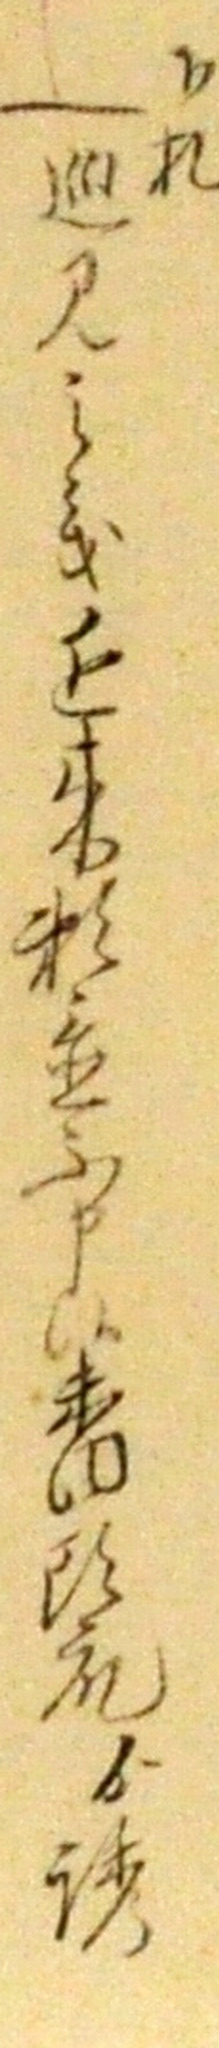巡見之義近来頼置不申候番頭衆ゟ誘
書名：大阪加番関係諸書留〔一括〕
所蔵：伊那市立高遠町図書館・合同会社AMANE
